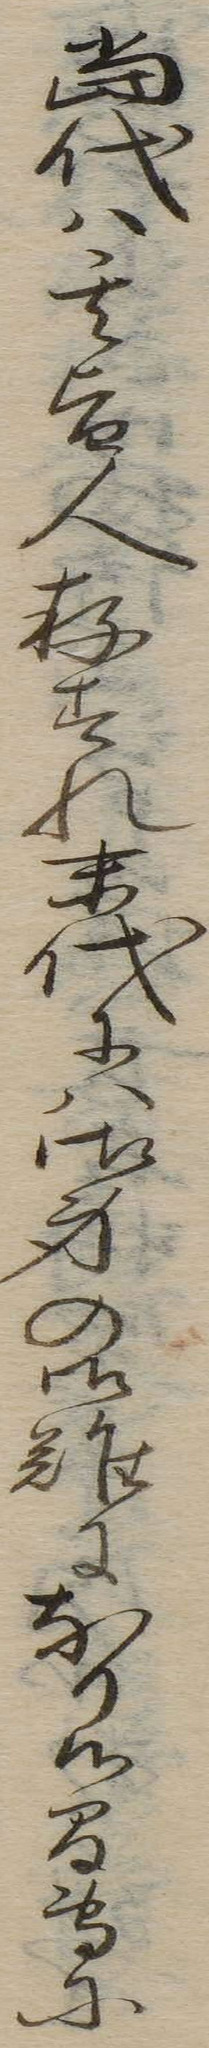当代は其旨人存すれ末代には御身の御難になり候間専に
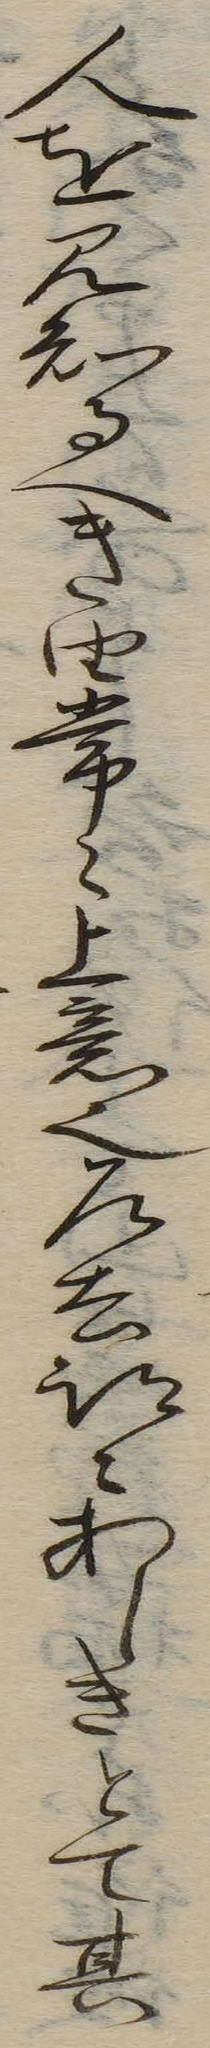人を見知るへき由常々上意也乍去跡にあしきとて其
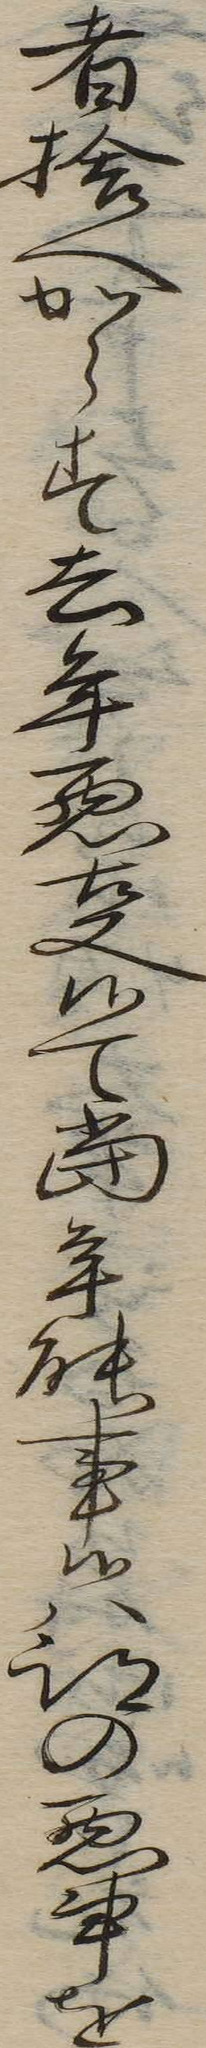者捨へからす去年悪事候て当年能事候は跡の悪事を
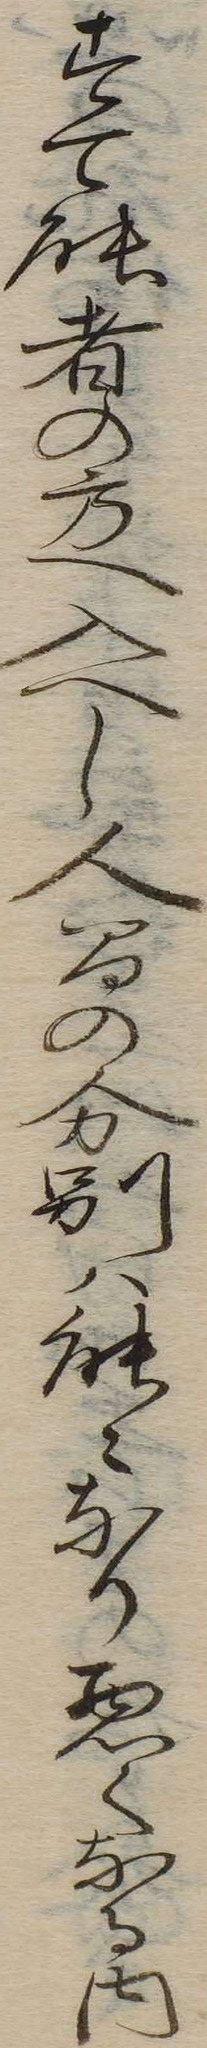すて能者の方へ入へし人間の分別は能になり悪くなる内
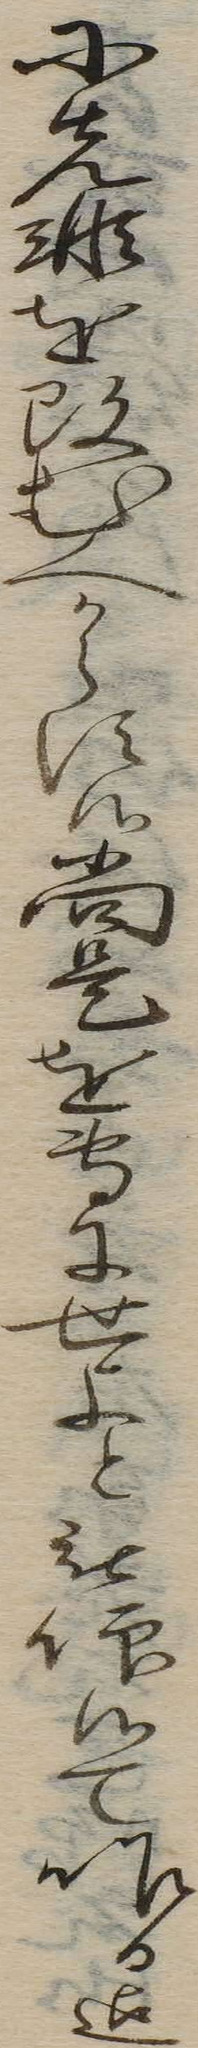に先非を改むへからす候尚是を専にせよと被仰候て昨日迄
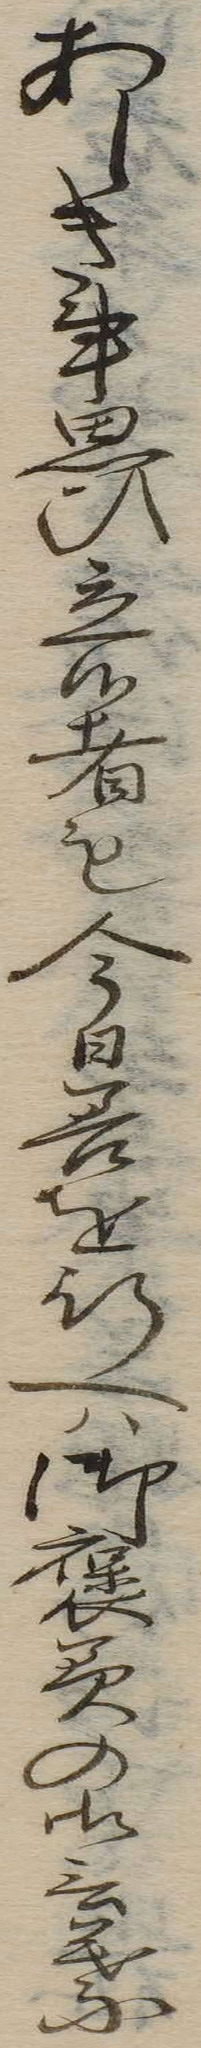あしき事思ひ立候者も今日善を行へは御褒美の御言葉
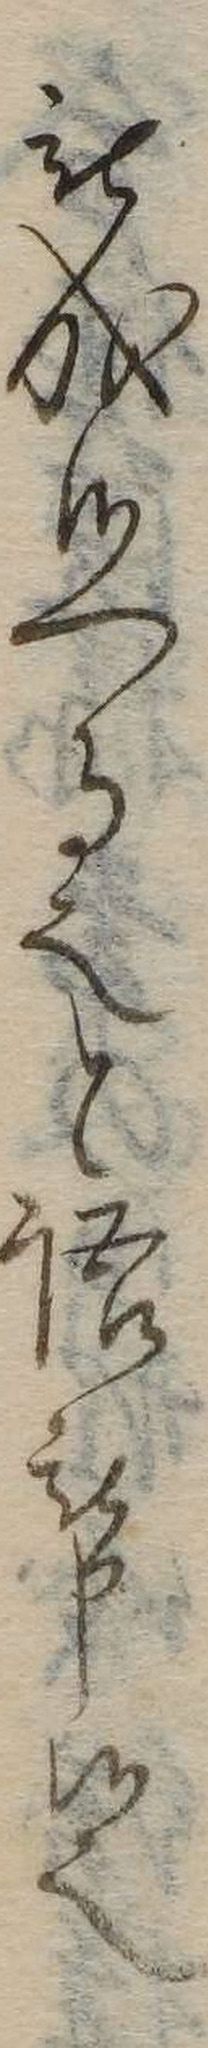被成候つる也と語被申候也
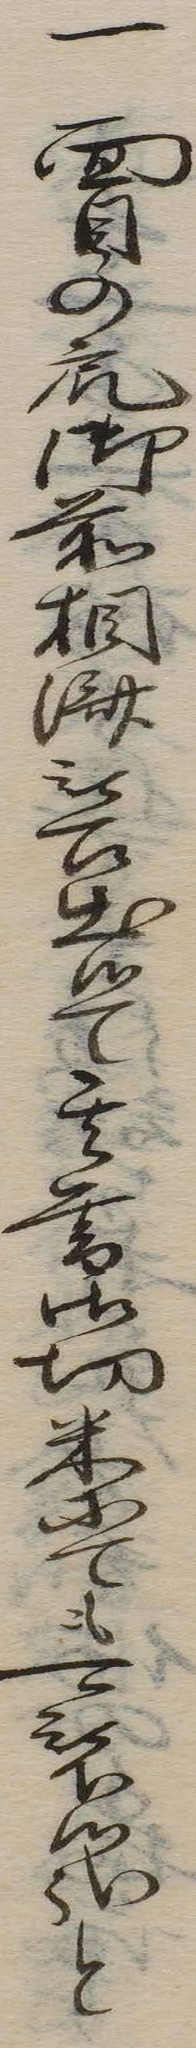一面目の衆御前相済被召出候て其蓄御切米にても可被下候哉と
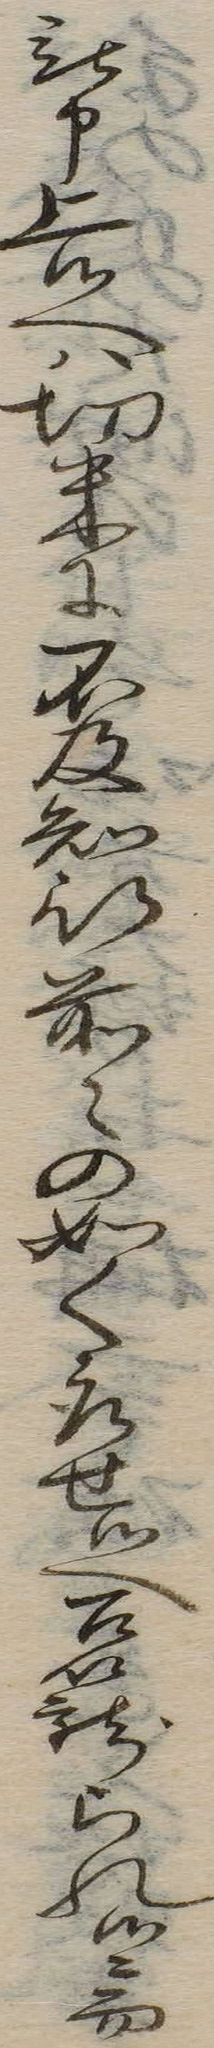被申上候へは切米に不及知行前々の如く取せ候へ召籠被られ候に而
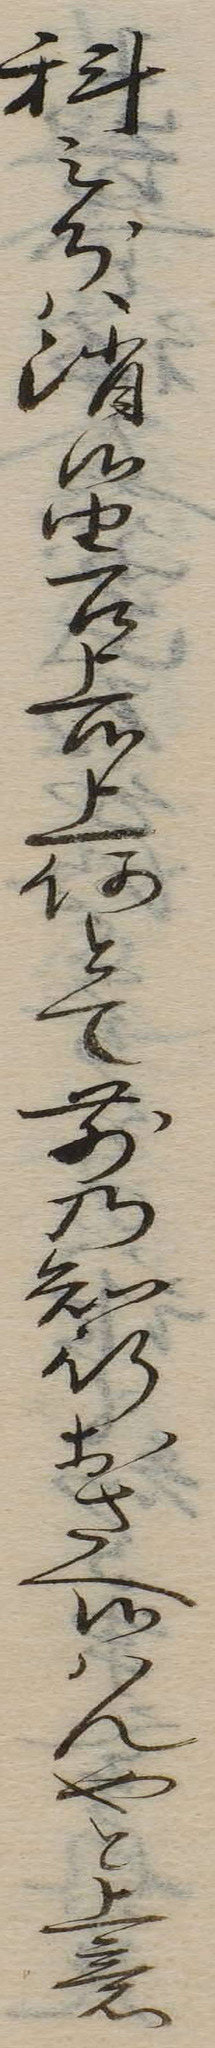科之分は消候由召上候上何とて前の知行おさへ候はんやと上意
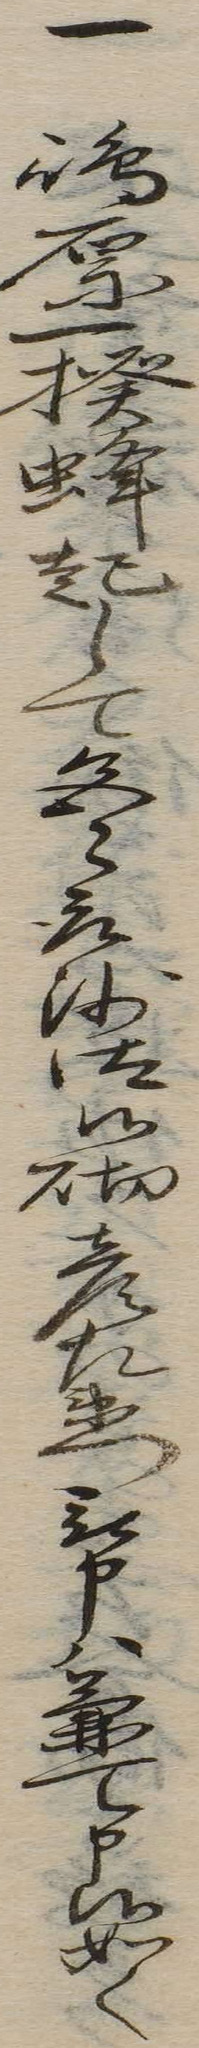一嶋原一揆蜂起して色々取沙汰候砌彦左衛門被申は兼て申候如く
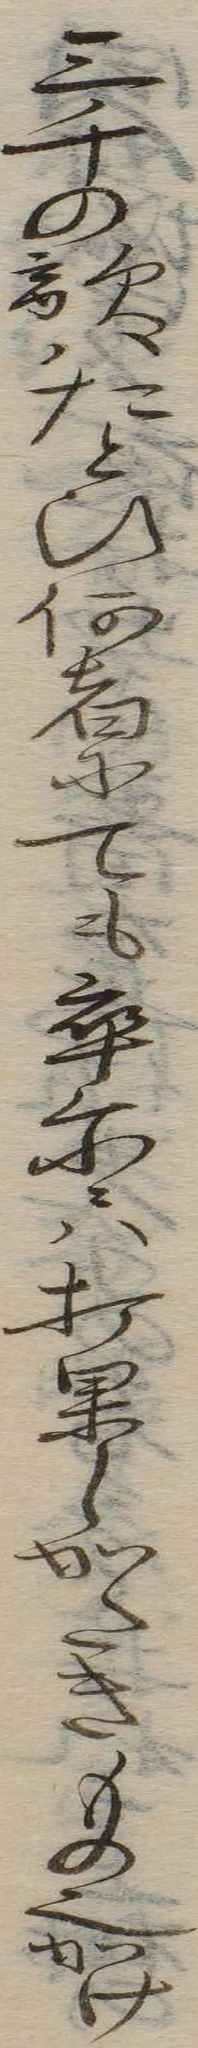三千の敵はたとひ何者にても卒爾ニは打果しかたきもの也かけ
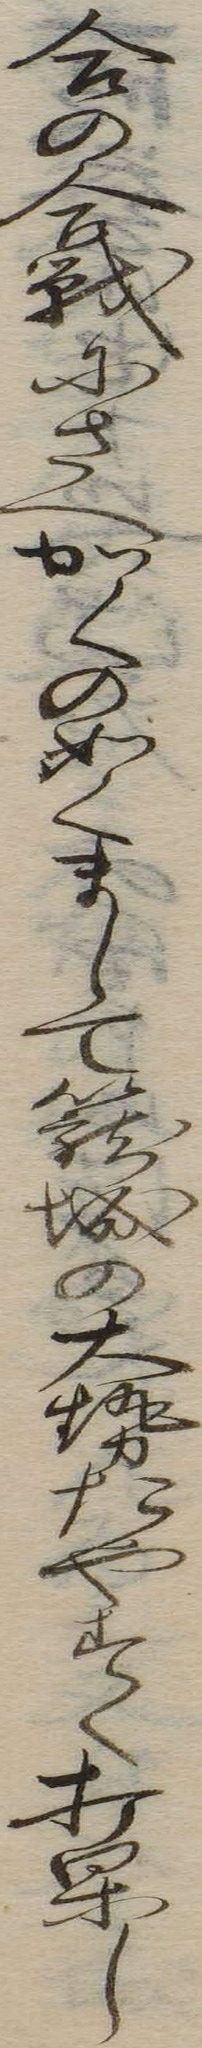合の合戦にさへかくの如くまして籠城の大勢たやすく打果し
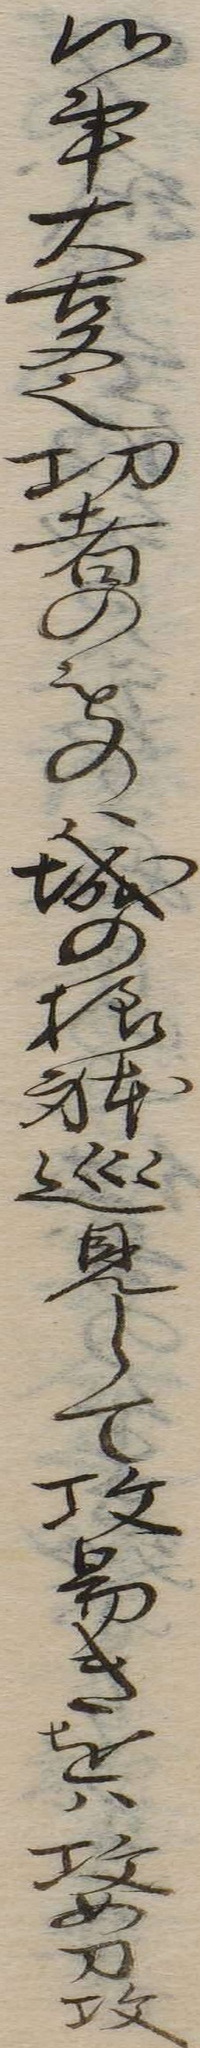候事大事也功者のものゝ城の様体巡見して攻易きをは攻め刀攻
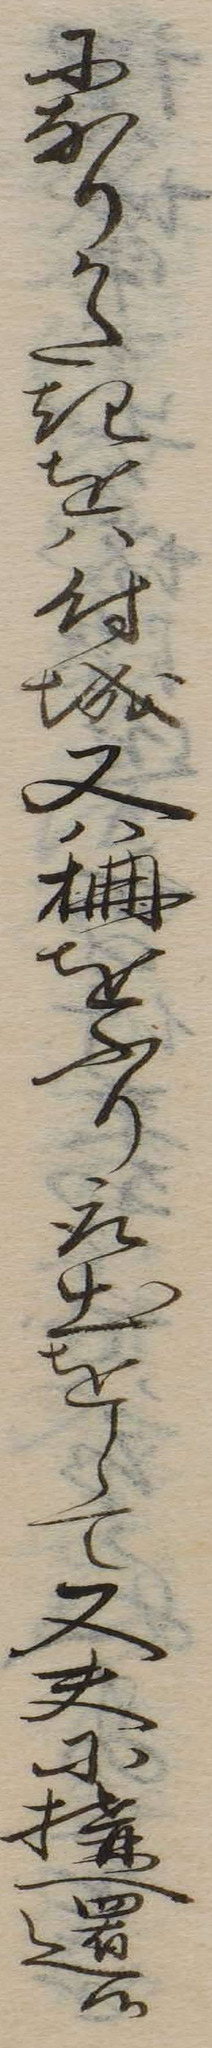になりかたきをは付城又は柵をふり取出をして又夫に構へ還候
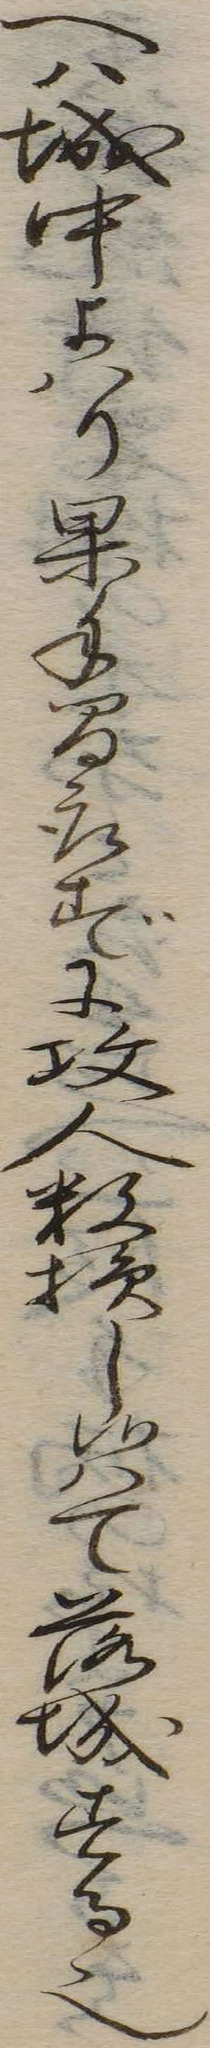へは城中よはり果手間取ずに攻入数損し候はて落城する也
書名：三河之物語
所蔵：国文学研究資料館
